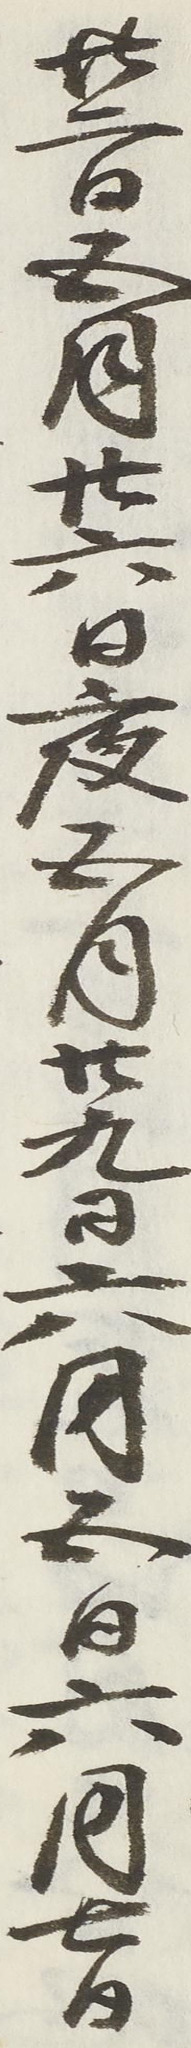廿二日五月廿六日夜五月廿九日六月五日六月七日
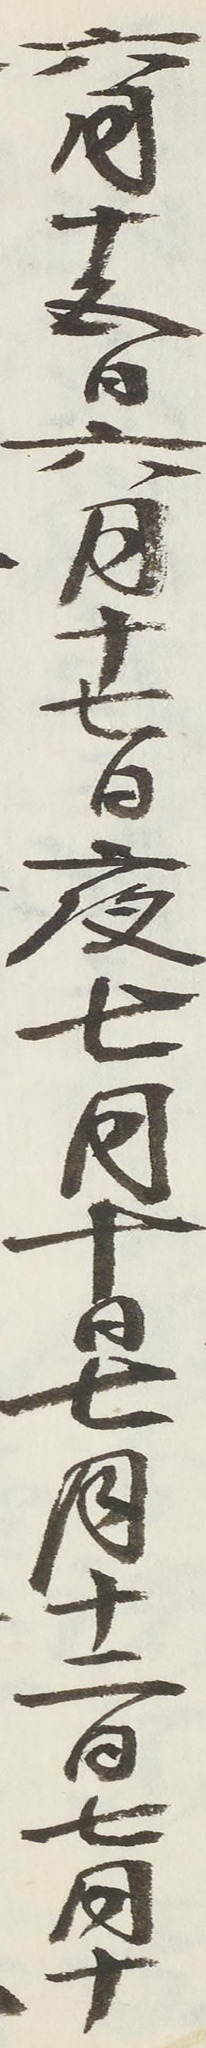六月十五日六月十七日夜七月十日七月十二日七月十
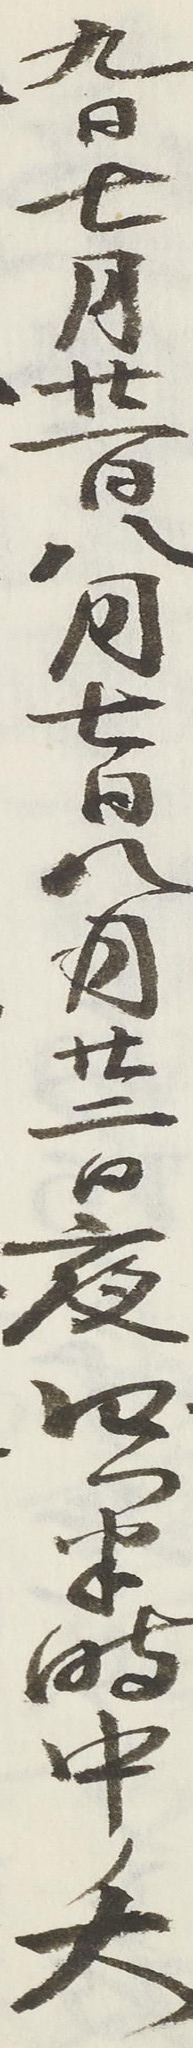九日七月廿一日八月七日八月廿二日夜四ッ半時中ノ大
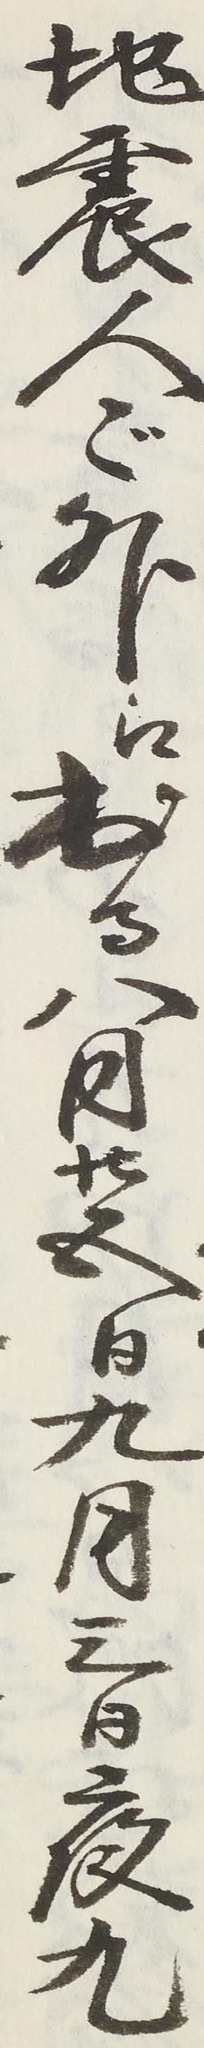地震人々外江出る八月廿五日九月三日夜九
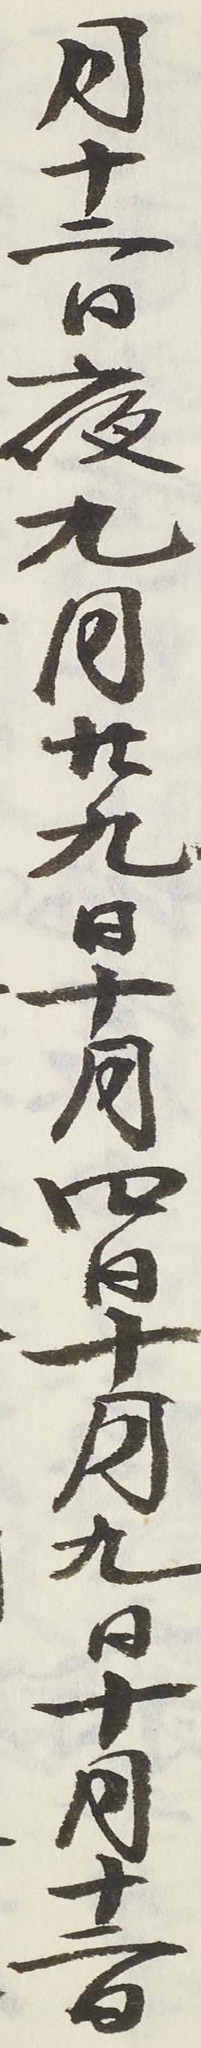月十二日夜九月廿九日十月四日十月九日十月十二日
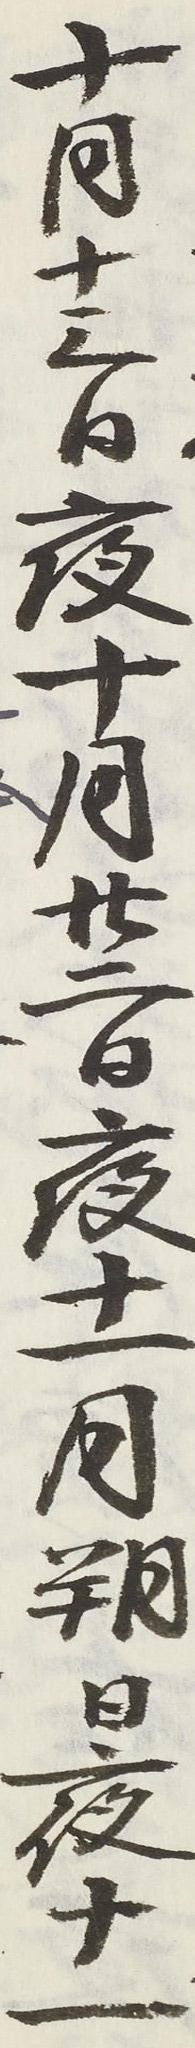十月十三日夜十月廿二日夜十一月朔日夜十一
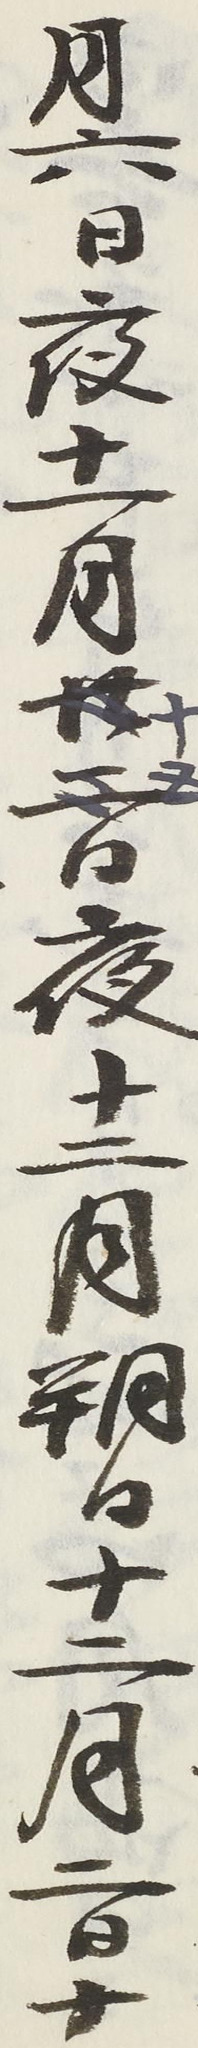月六日夜十一月十五日夜十二月朔日十二月二日十
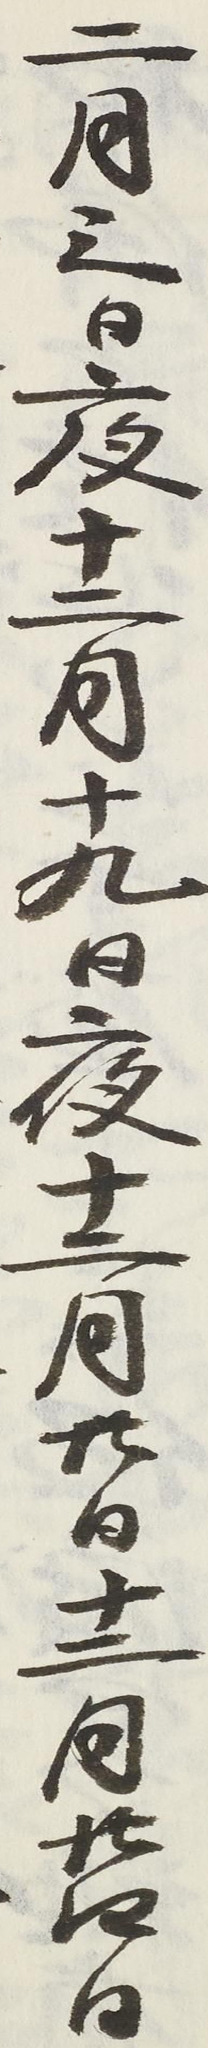二月三日夜十二月十九日夜十二月廿日十二月廿四日
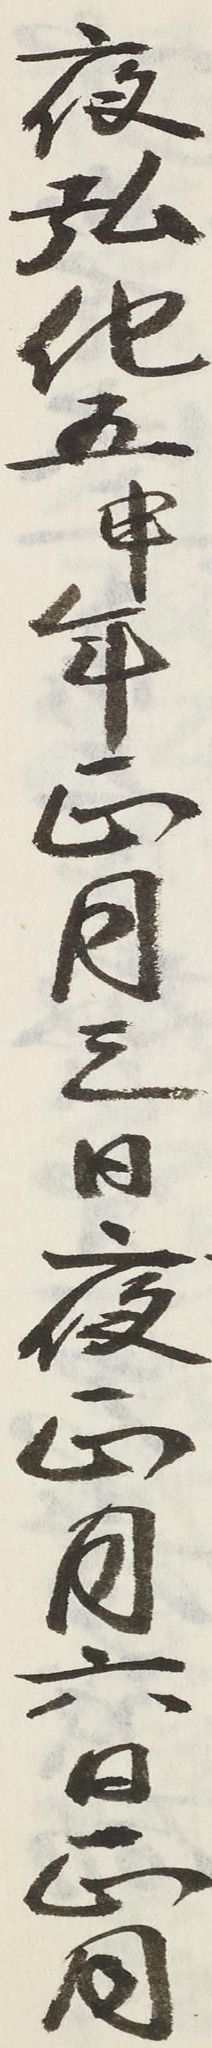夜弘化五申年正月三日夜正月六日正月
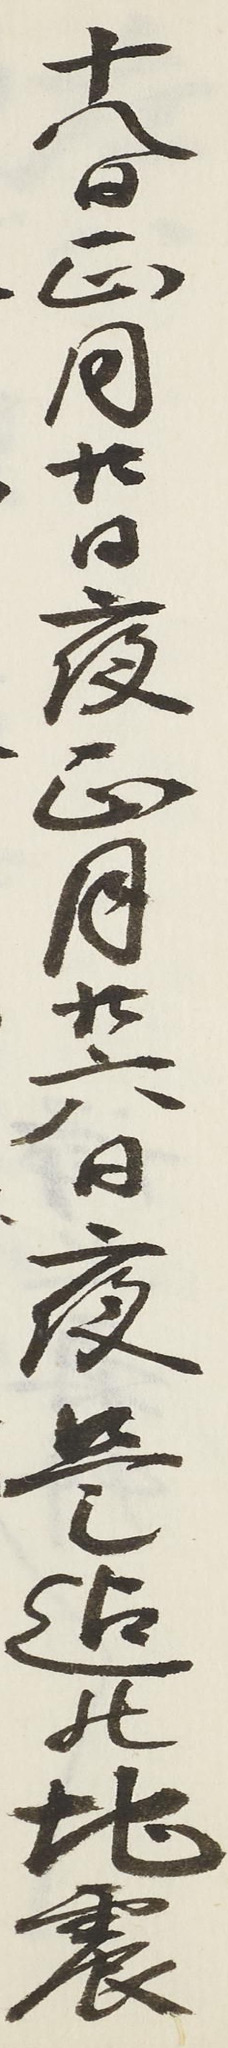十八日正月廿日夜正月廿六日夜是迄の地震
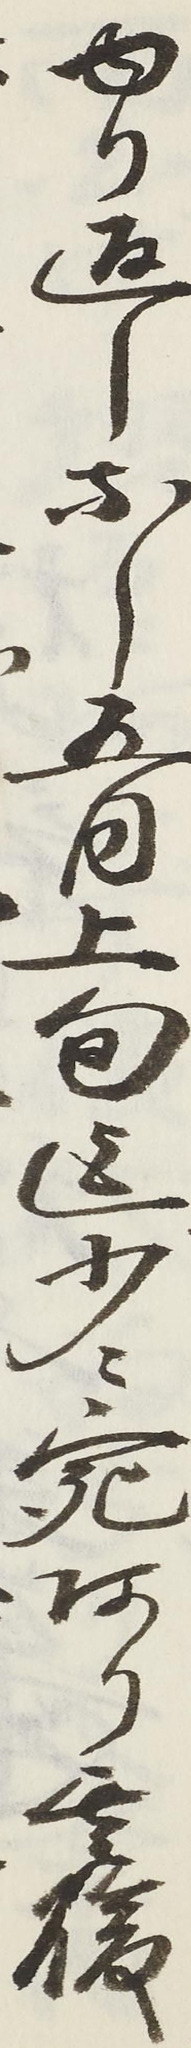ゆり通しなし五月上旬迄少々宛あり其後
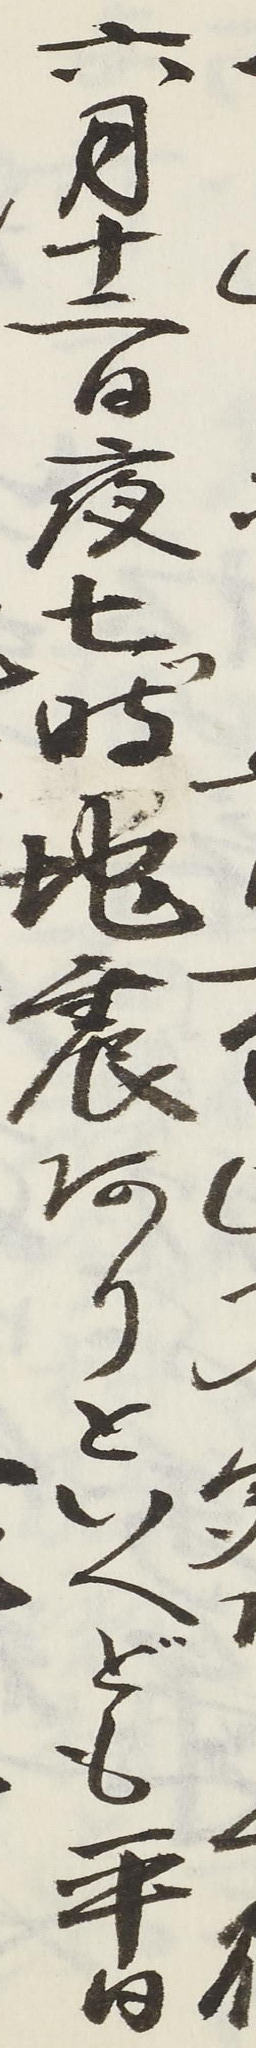六月十二日夜七ッ時地震ありといへども平日
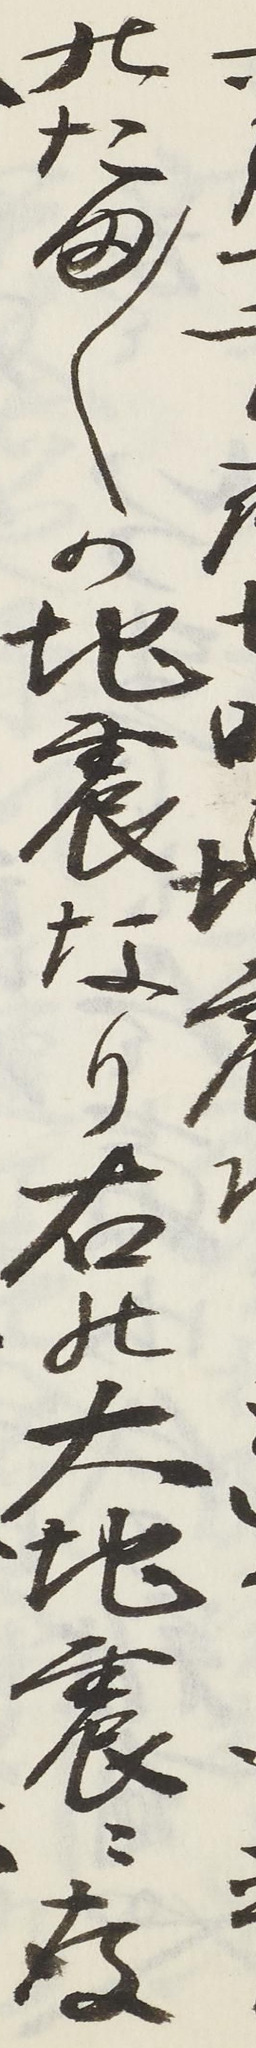のたま〳〵の地震なり右の大地震二存
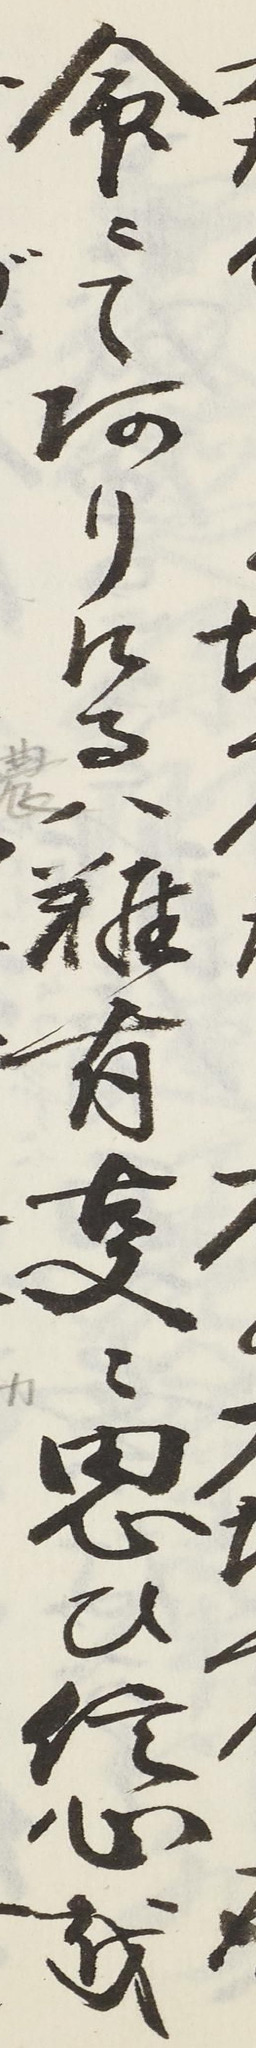命二てありたるハ難有事二思ひ信心を
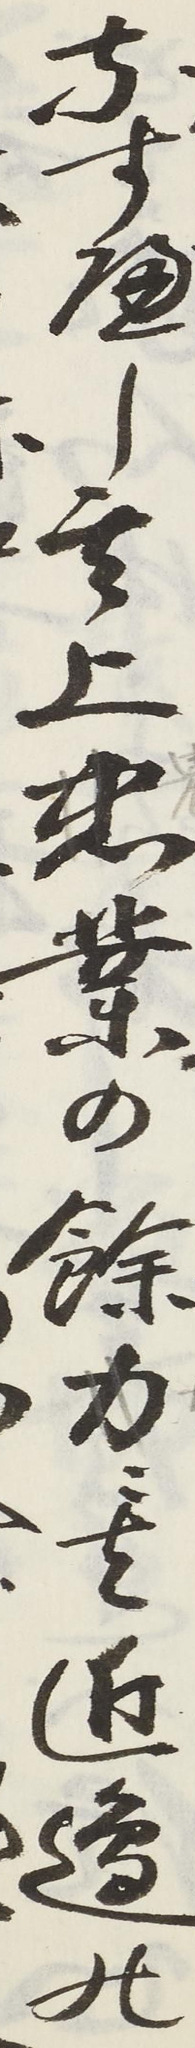なすべし其上忠業の餘力二は近辺の
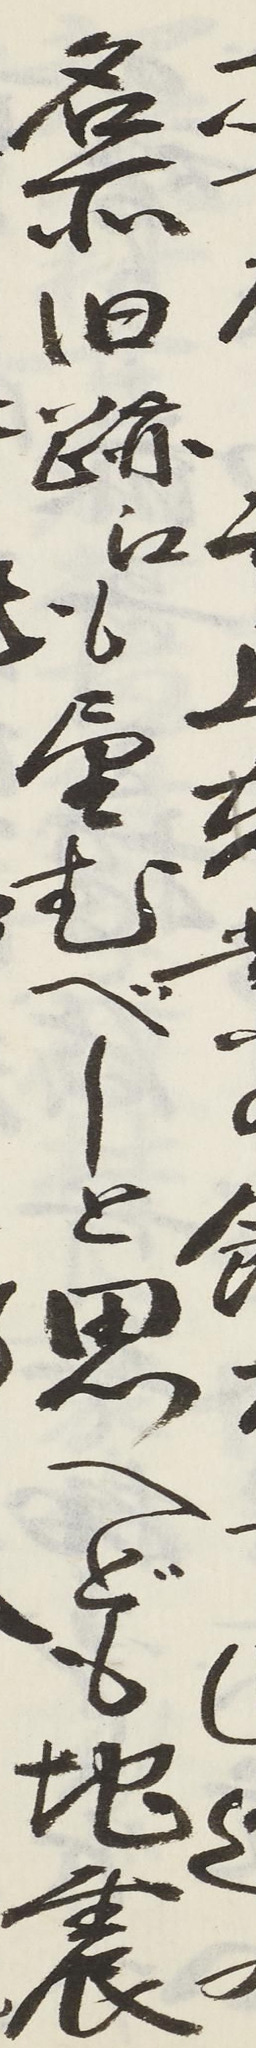名所旧跡江も望むべしと思へども地震
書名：弘化四年地震記
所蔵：東京大学地震研究所図書室 Earthquake Research Institute Library, The University of Tokyo, JAPAN
